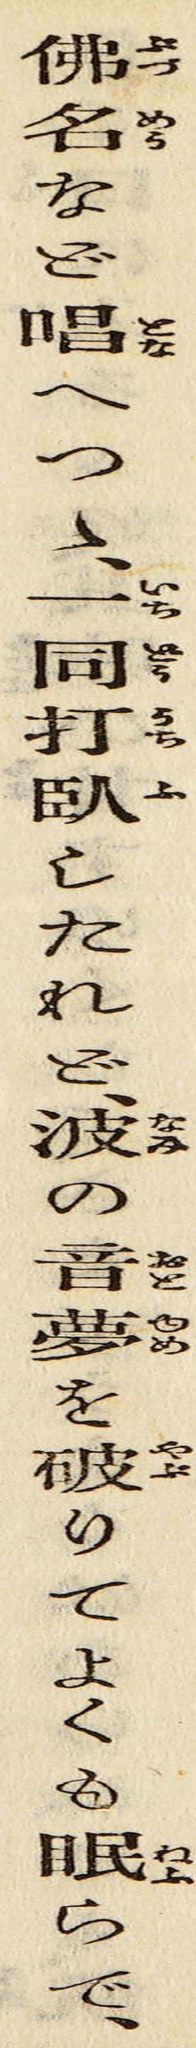仏名など唱へつゝ、一同打臥したれど、波の音夢を破りてよくも眠らで、
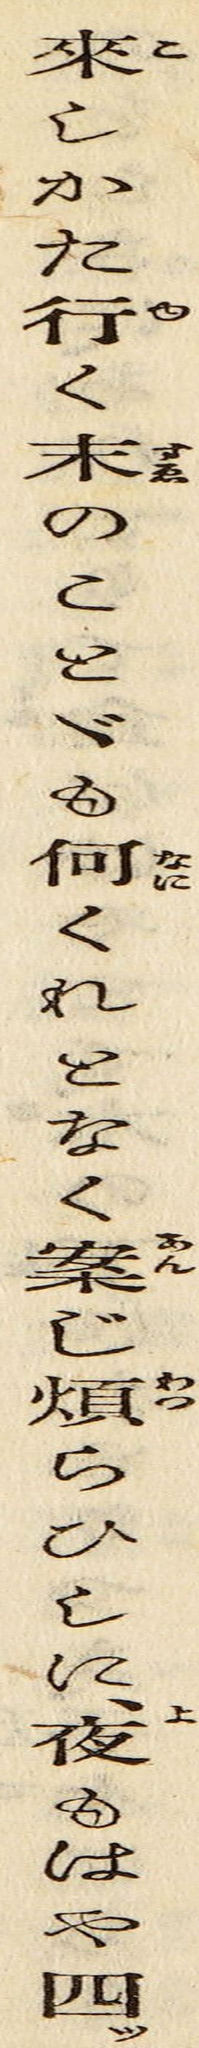来しかた行く末のことヾも何くれとなく案じ煩らひしに、夜もはや四ッ
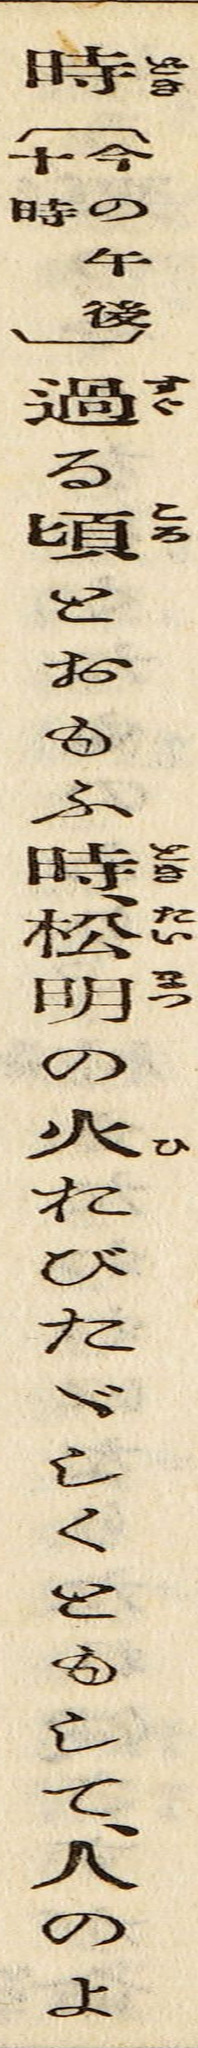時[今の午後十時]過る頃とおもふ時、松明の火おびたヾしくともして、人のよ
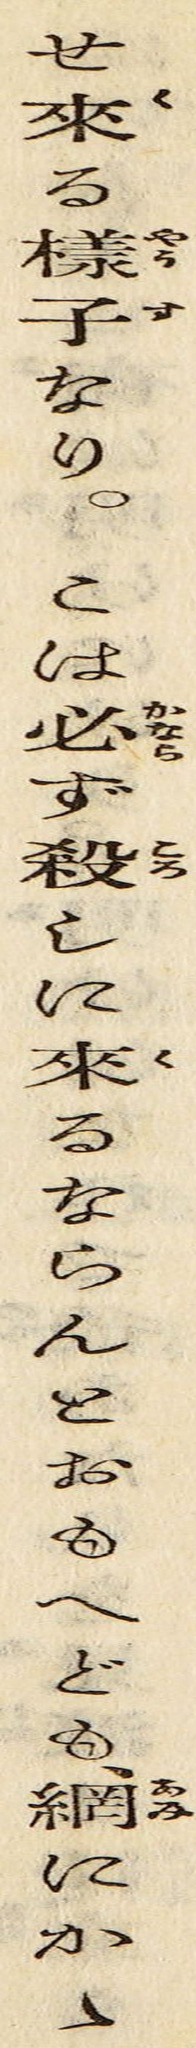せ来る様子なり。こは必ず殺しに来るならんとおもへども、網にかゝ
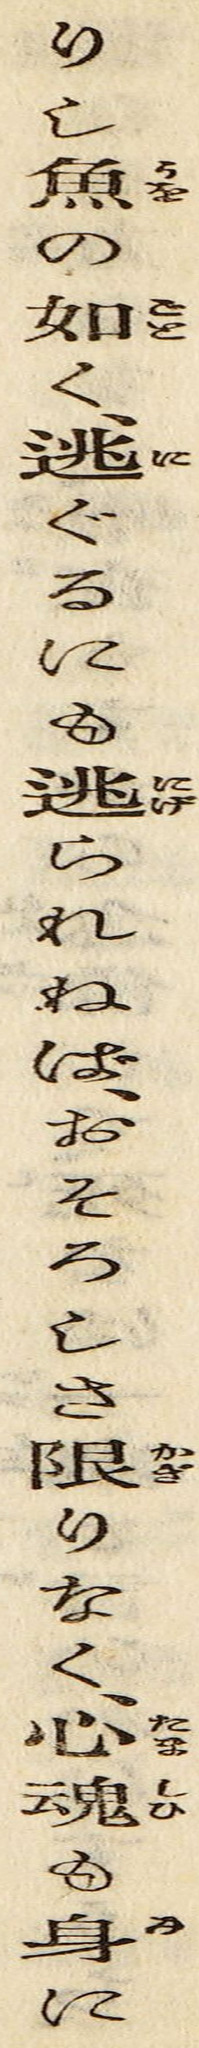りし魚の如く、逃ぐるにも逃られねば、おそろしさ限りなく、心魂も身に
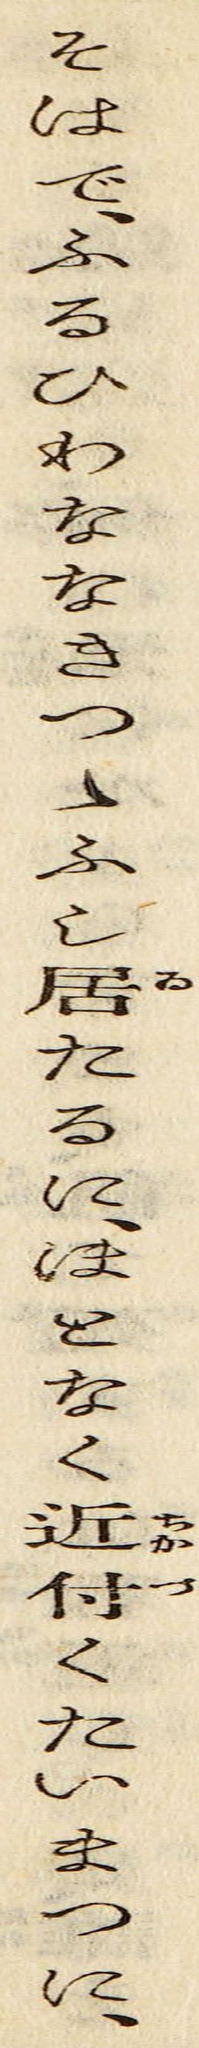そはで、ふるひわななきつゝふし居たるに、ほとなく近付くたいまつに、
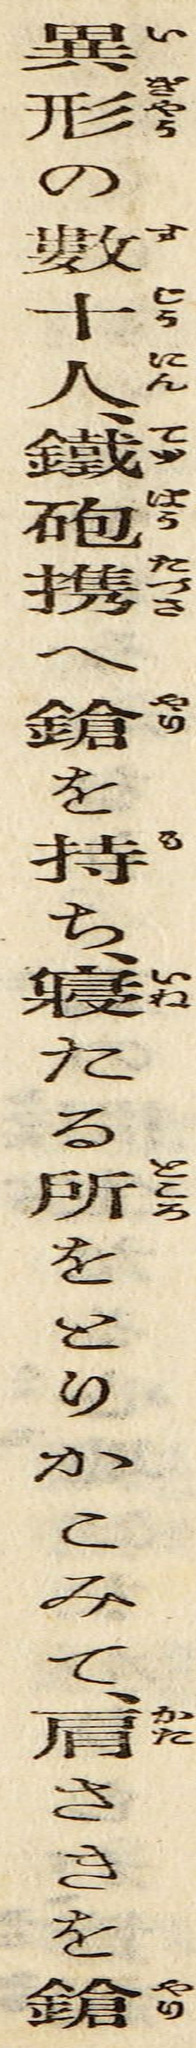異形の数十人、鉄砲携へ鎗を持ち、寝たる所をとりかこみて、肩さきを鎗
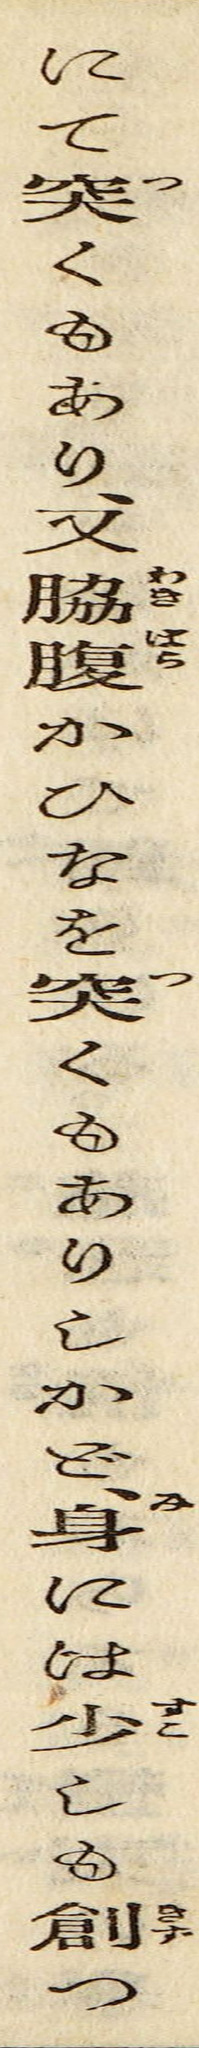にて突くもあり、又脇腹かひなを突くもありしかど、身には少しも創つ
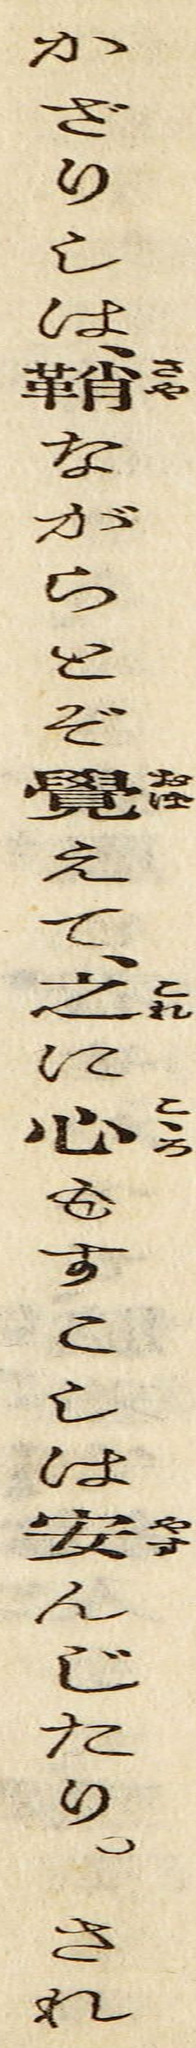かざりしは、鞘ながらとぞ覚えて、之に心もすこしは安んじたり。され
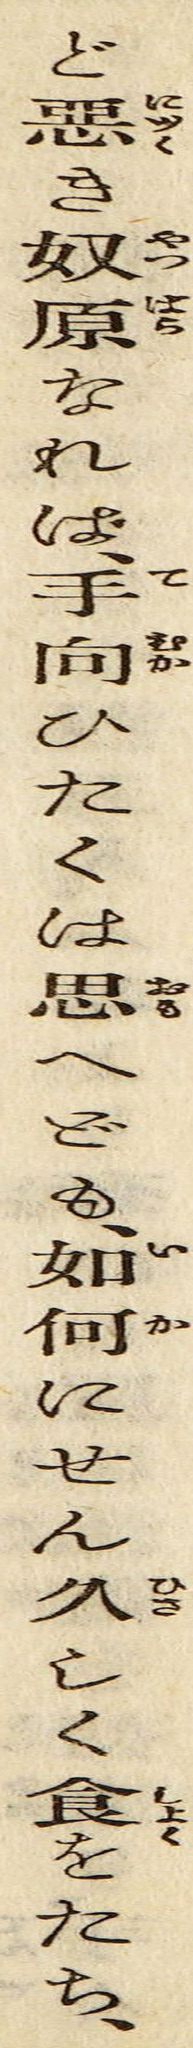ど悪き奴原なれば、手向ひたくは思へども、如何にせん久しく食をたち、
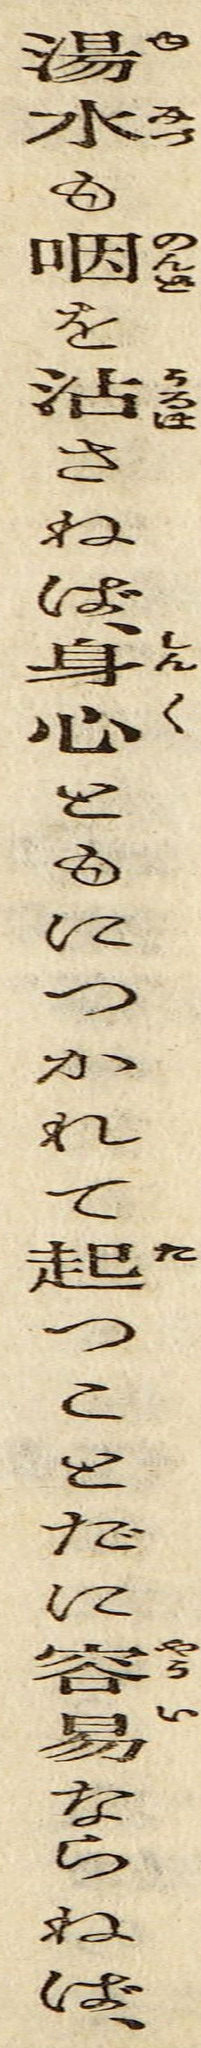湯水も咽を沾さねば、身心ともにつかれて起つことだに容易ならねば、

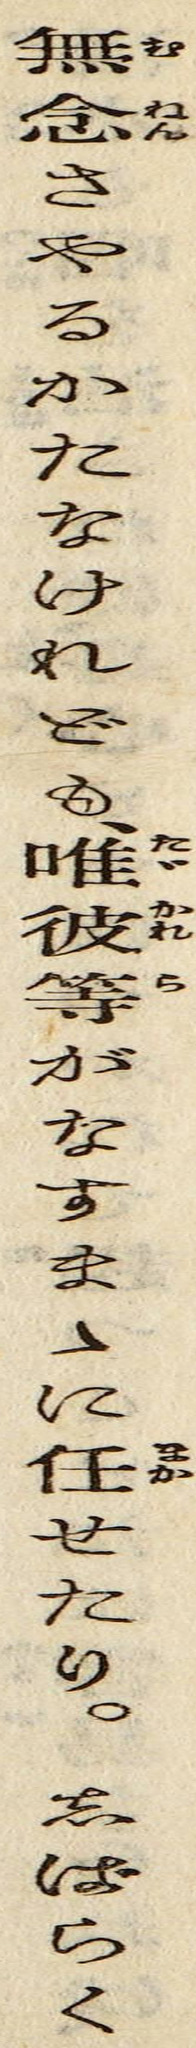無念さやるかたなけれども、唯彼等がなすまゝに任せたり。しばらく
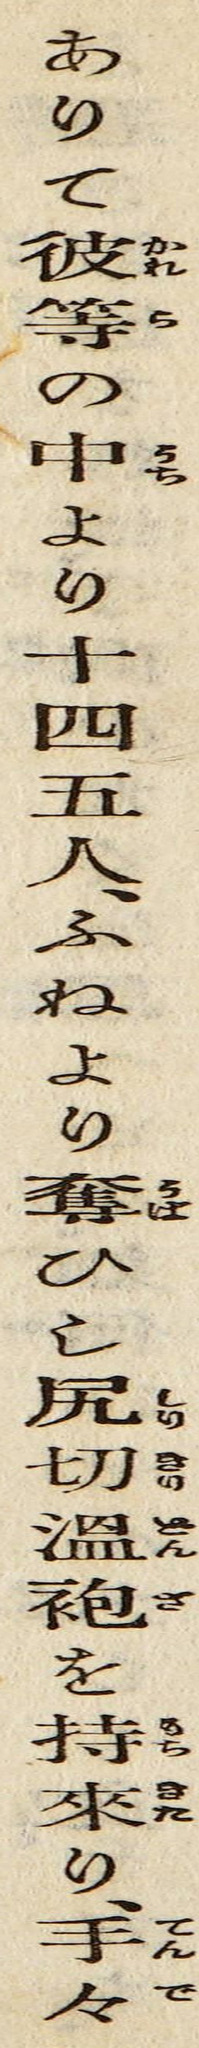ありて彼等の中より十四五人、ふねより奪ひし尻切温袍を持来り、手々
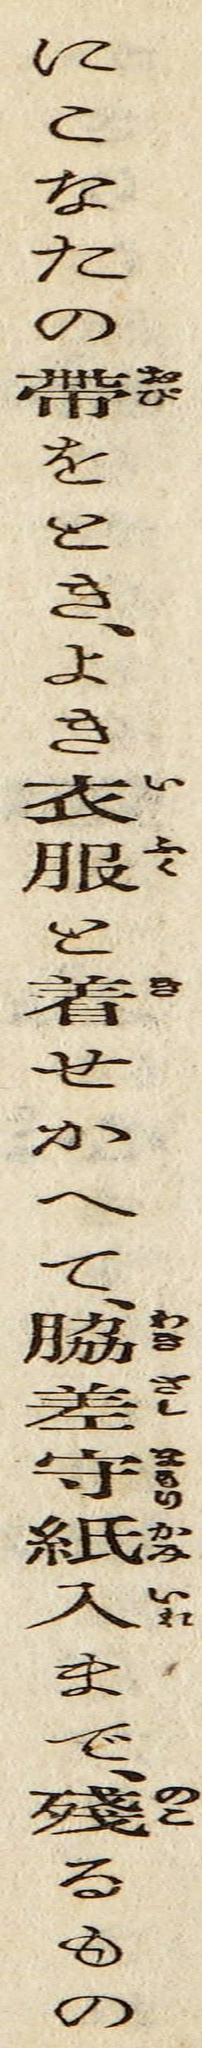にこなたの帯をとき、よき衣服と着せかへて、脇差守紙入まで、残るもの
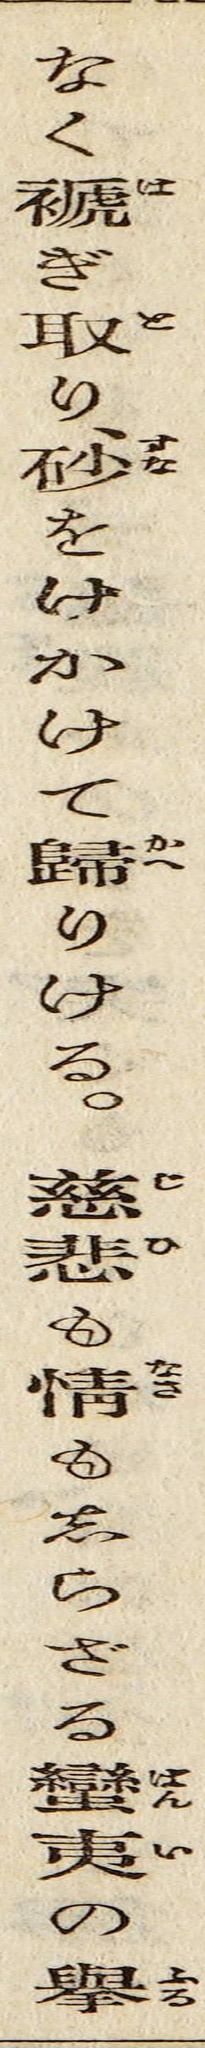なく褫ぎ取り、砂をけかけて帰りける。慈悲も情もしらざる蛮夷の挙
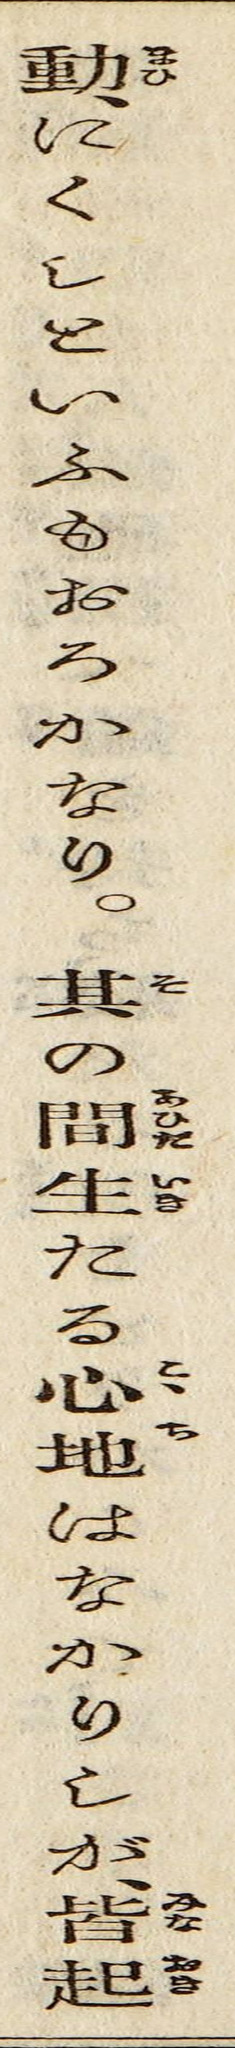動、にくしといふもおろかなり。其の間生たる心地はなかりしが、皆起
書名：日本漂流譚
